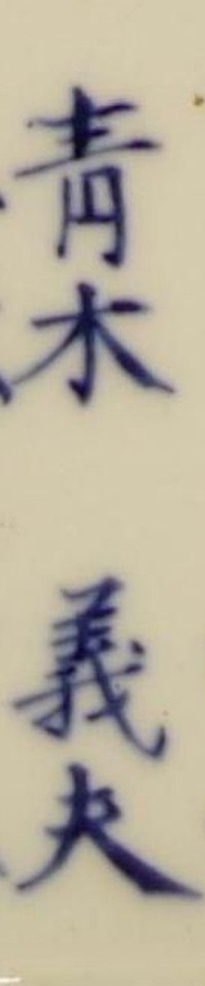青木義夫
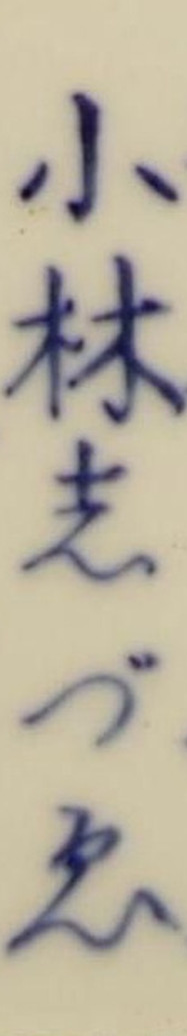小林しづえ
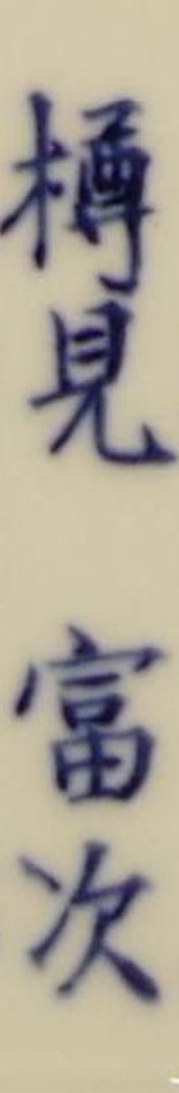樽見富次
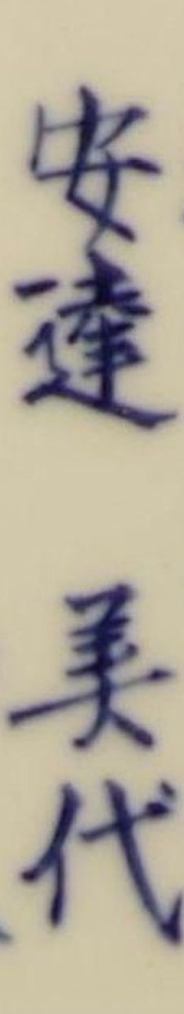安達美代
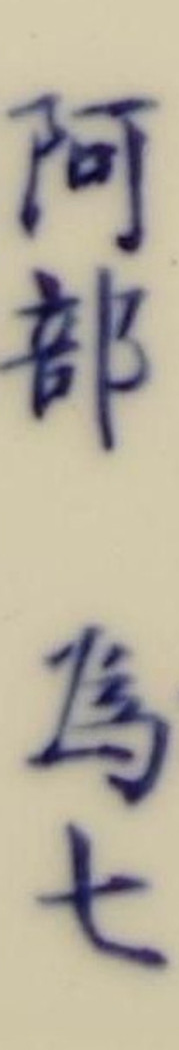阿部為七
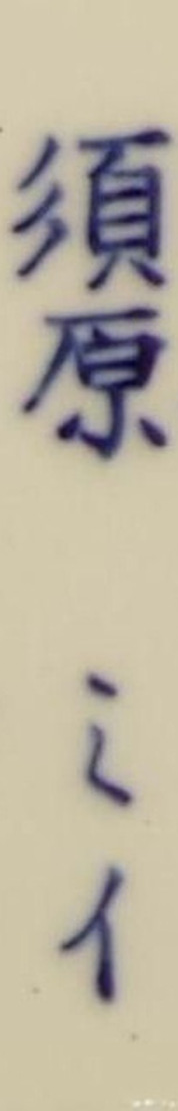須原ミイ
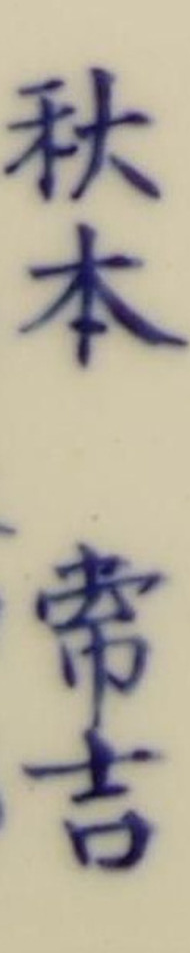秋本常吉
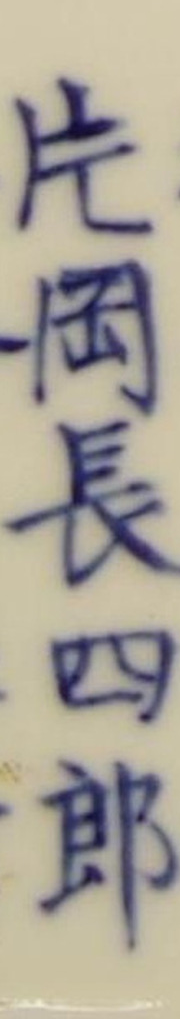片岡長四郎
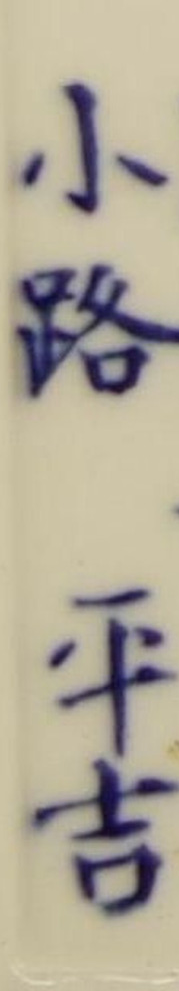小路平吉

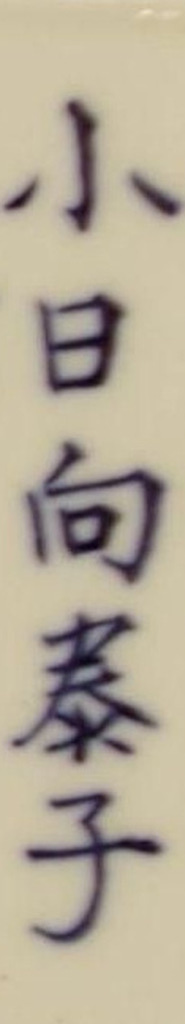小日向泰子
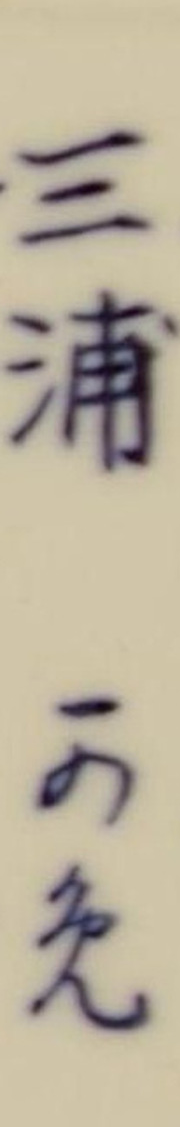三浦かめ
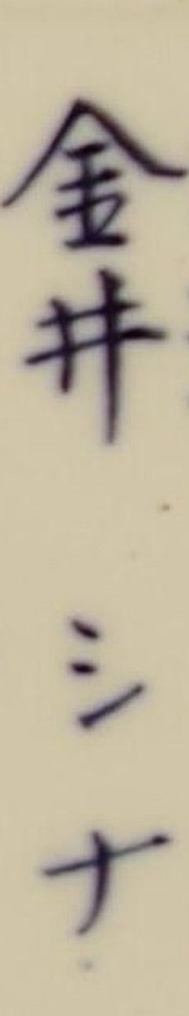金井シナ
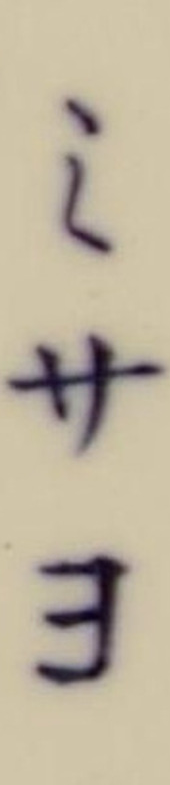ミサヨ
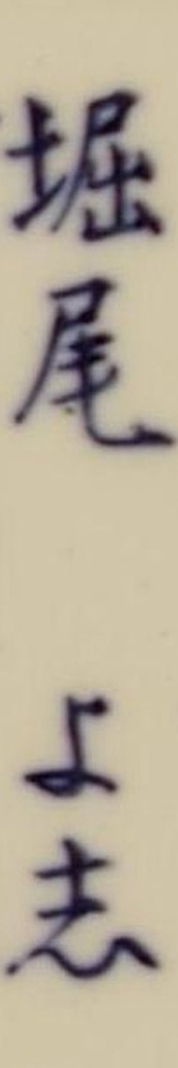堀尾よし
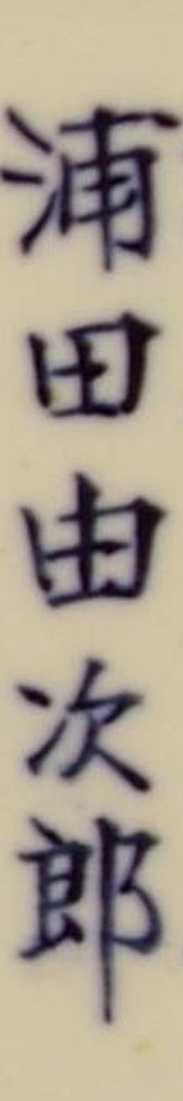浦田由次郎
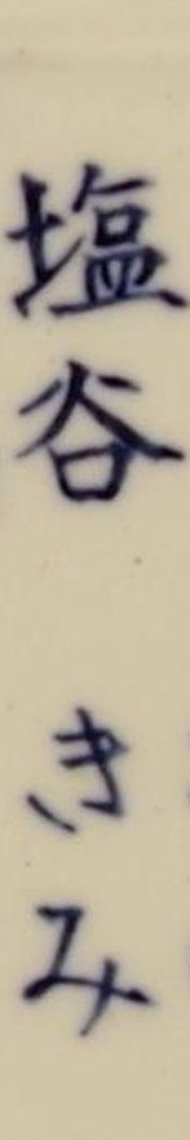塩谷きみ
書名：E~L
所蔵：高野山金剛峯寺
